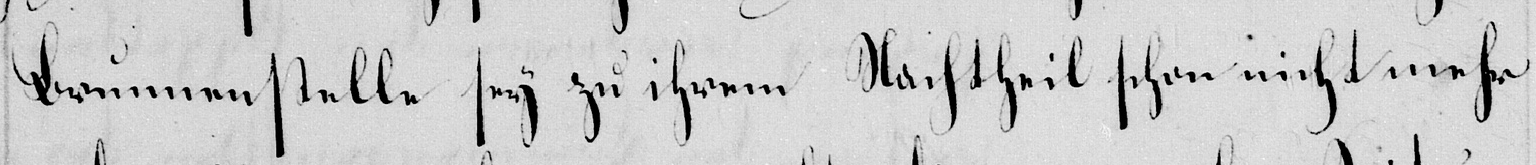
Brunnenstelle sey zu ihrem Nachtheil schon nicht mehr
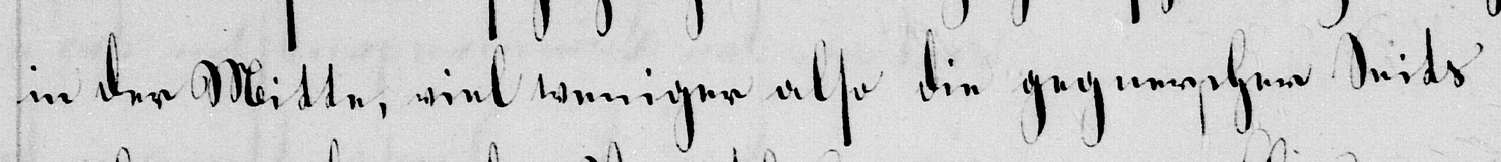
in der Mitte, viel weniger also die gegnerscher Seits
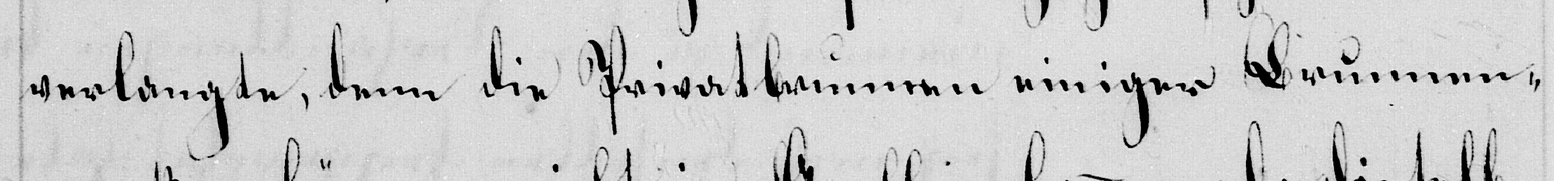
verlangte, denn die Privatbrunnen einiger Brunnen¬
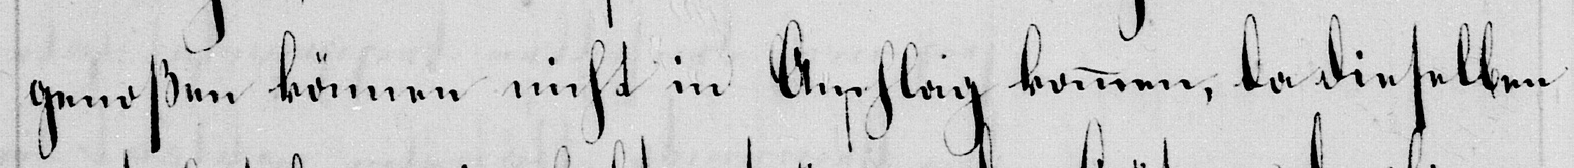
genoßen können nicht in Anschlag kommen, da dieselben
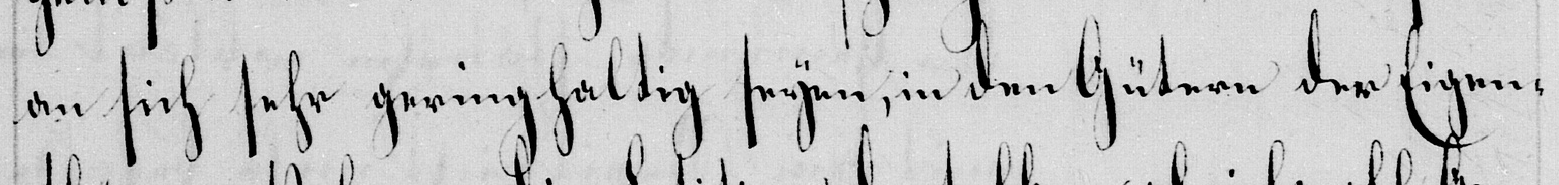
an sich sehr geringhaltig seyen, in den Gütern der Eigen¬
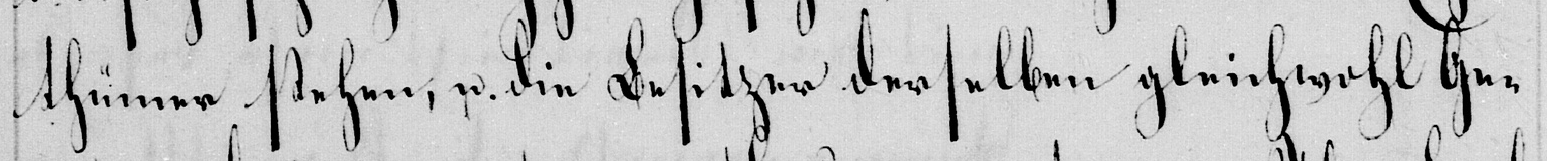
thümer stehen, u. die Besitzer derselben gleichwohl Ge¬
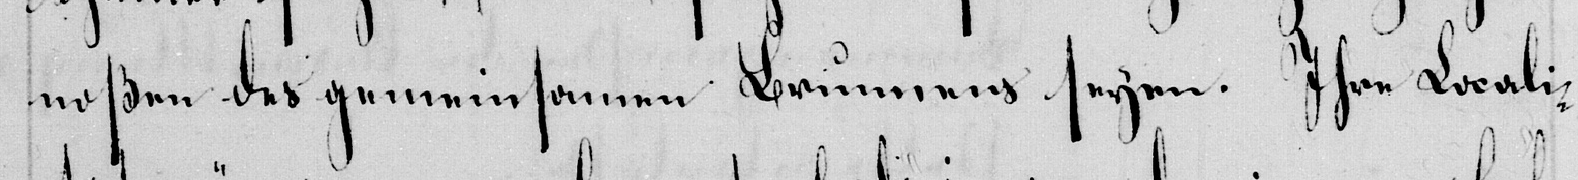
noßen des gemeinsamen Brunnens seyen. Ihre Locali¬
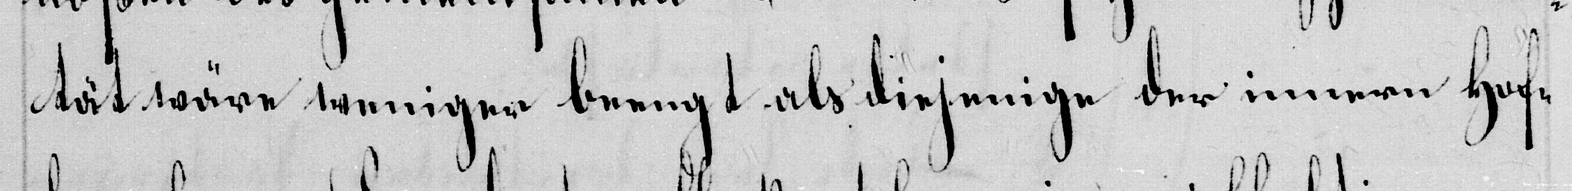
tät wäre weniger beengt als diejenige der innern Hof¬
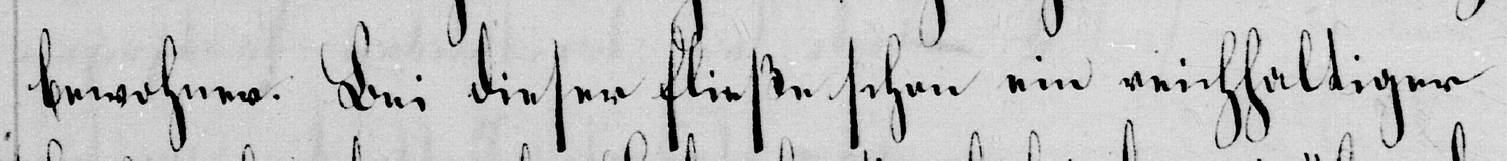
bewohner. Bei dieser fließe schon ein reichhaltiger
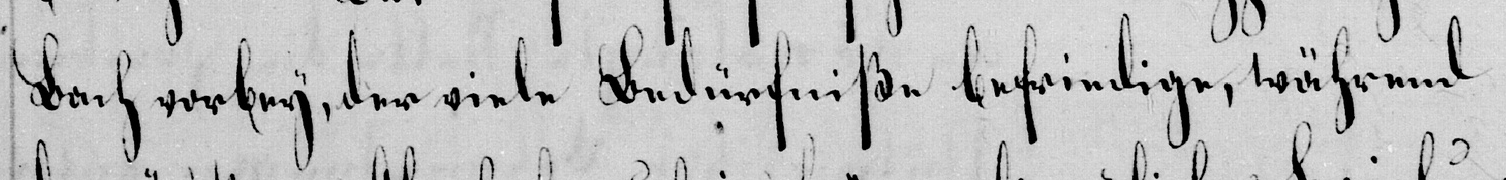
Bach vorbey, der viele Bedürfniße befriedige, während
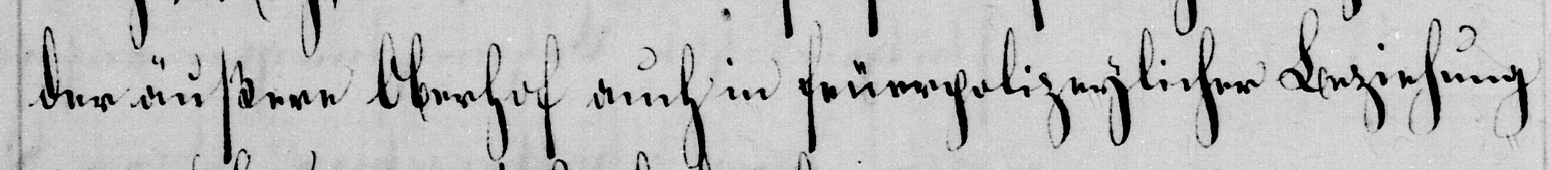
der äußere Oberhof auch in feuerpolizeylicher Beziehung
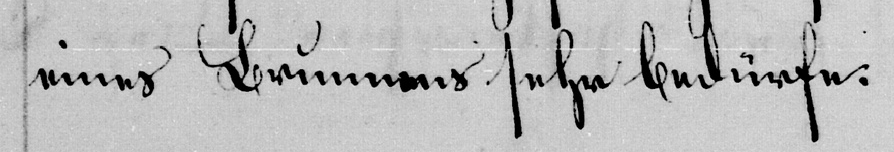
eines Brunnens sehr bedürfe.
